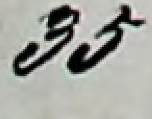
35
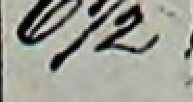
6 1/2
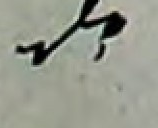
Do
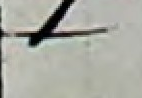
I
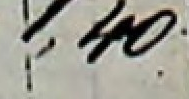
1,40
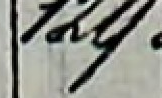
129
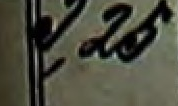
3,25
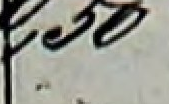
0,50
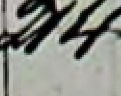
214
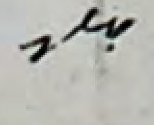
Do
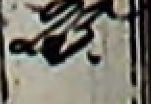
25
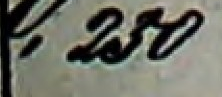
0,250
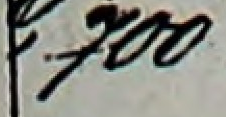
0,700
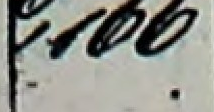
0,166
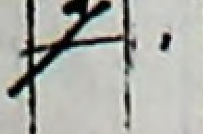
7
